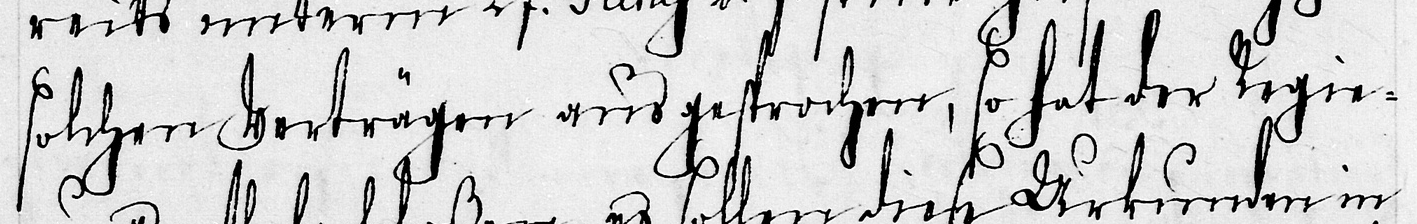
solchen Verträgen ausgesprochen, so hat der Regie¬
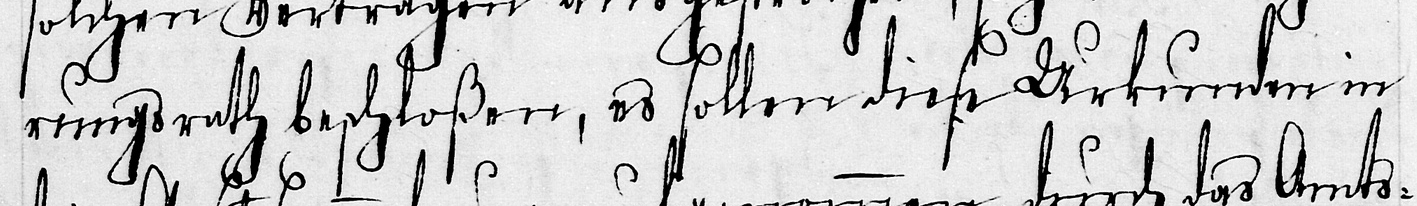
rungsrath beschloßen, es sollen diese Urkunden in
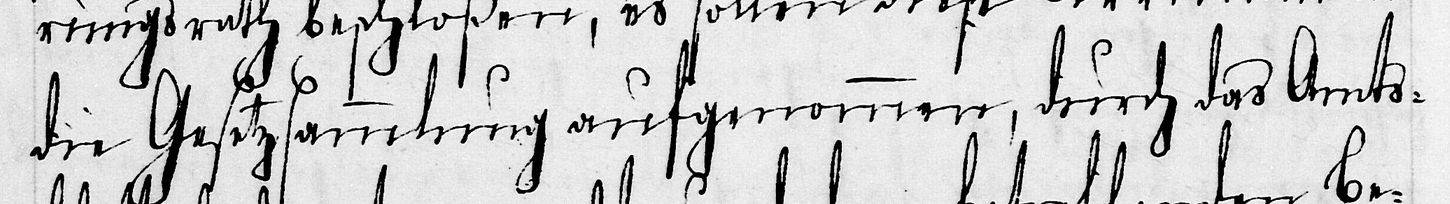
die Gesetzsammlung aufgenommen, durch das Amts¬
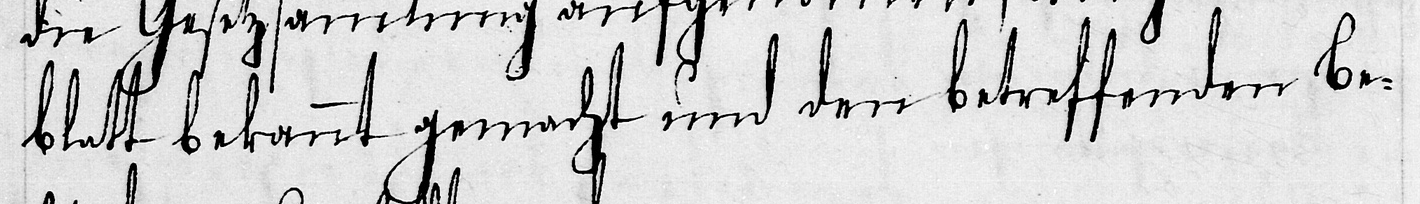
blatt bekannt gemacht und den betreffenden Be¬
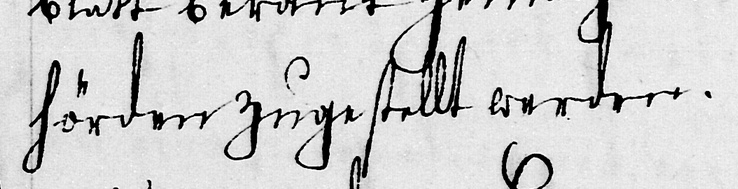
hörden zugestellt werden.
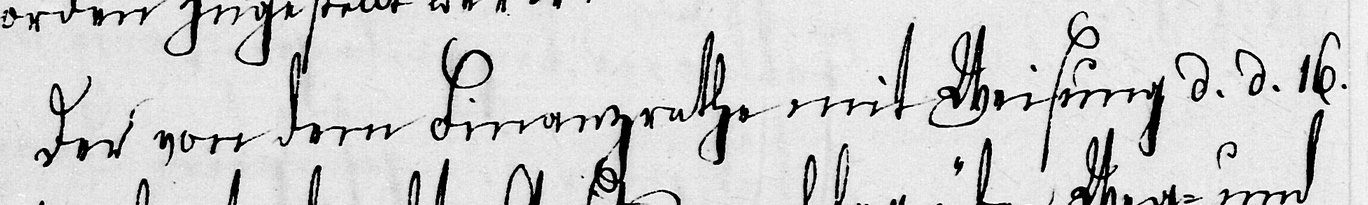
Der von dem Finanzrathe mit Weisung d. d. 16.
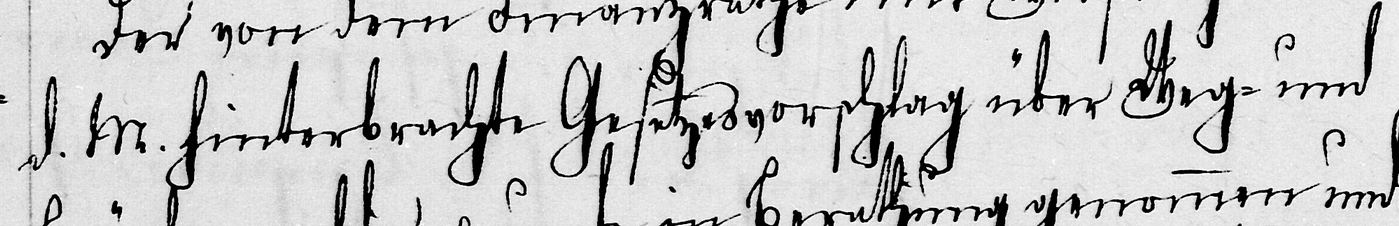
d. M. hinterbrachte Gesetzesvorschlag über Weg- und
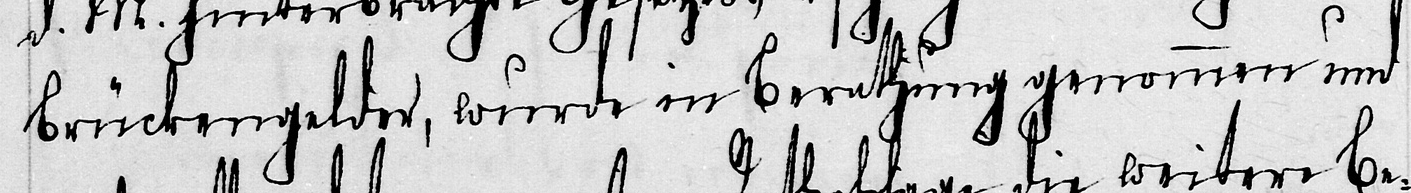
Brückengelder, wurde in Berathung genommen und
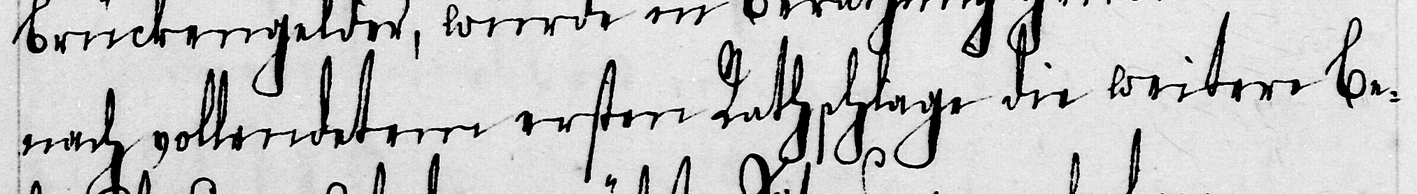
nach vollendetem ersten Rathschlage die weitere Be¬
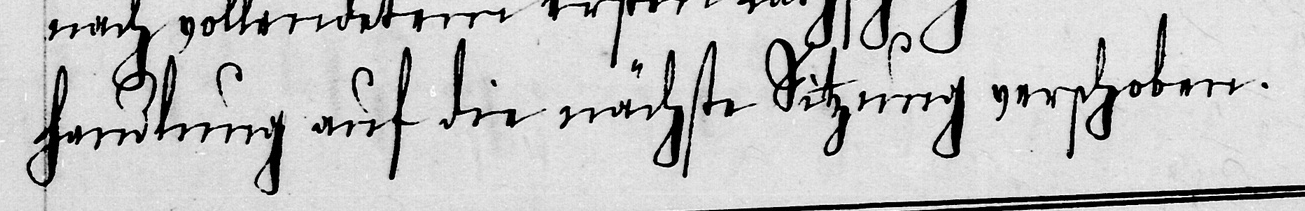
handlung auf die nächste Sitzung verschoben.
